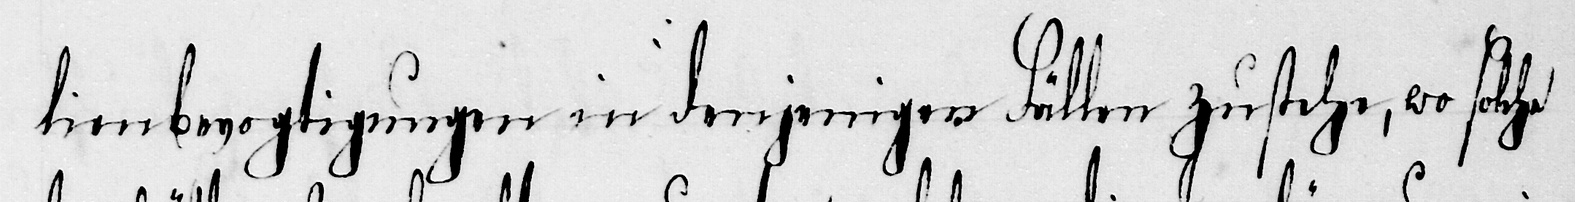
lienbevogtigungen in denjenigen Fällen zustehe, wo sol¬
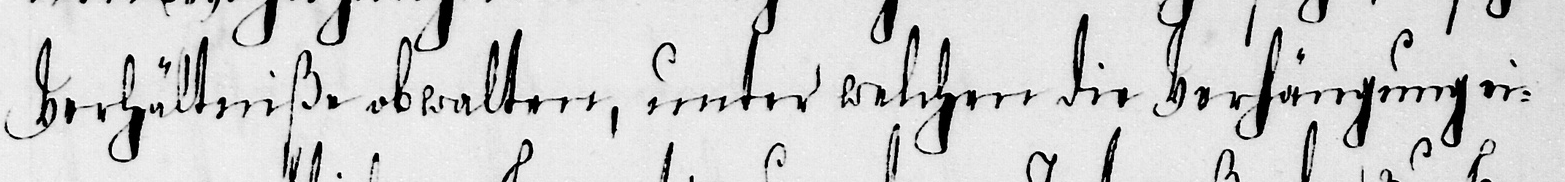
Verhältniße obwalten, unter welchen die Verhängung ein¬
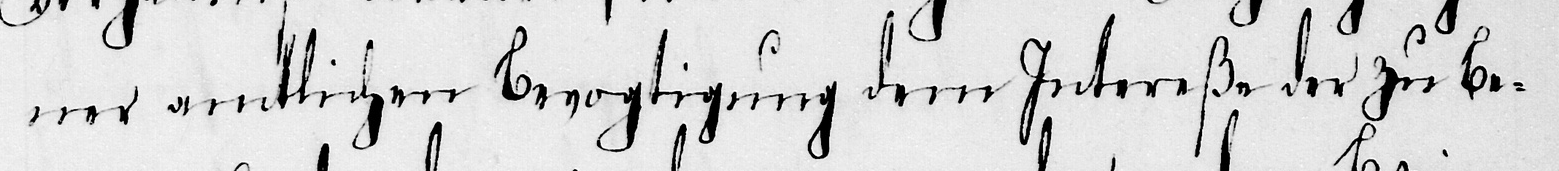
er amtlichen Bevogtigung dem Intereße der zu Be¬
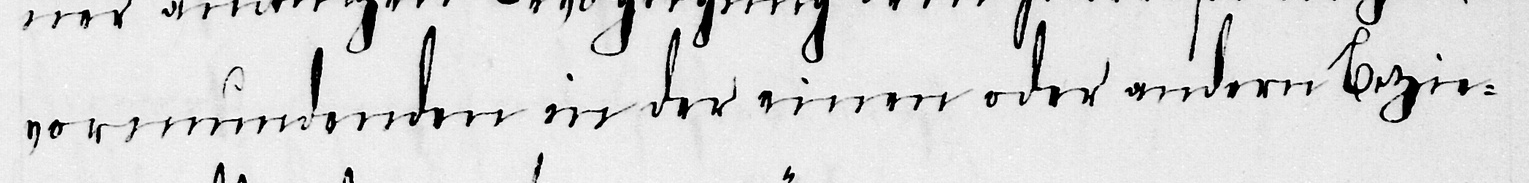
vormundenden in der einen oder andern Bezie¬
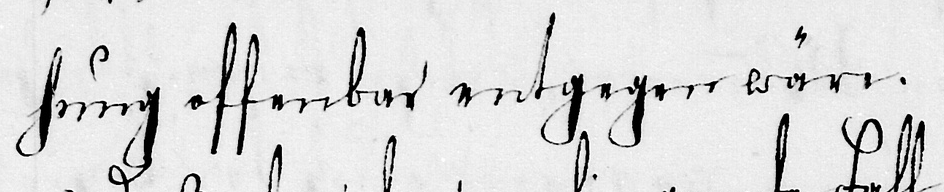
hung offenbar entgegen wäre.
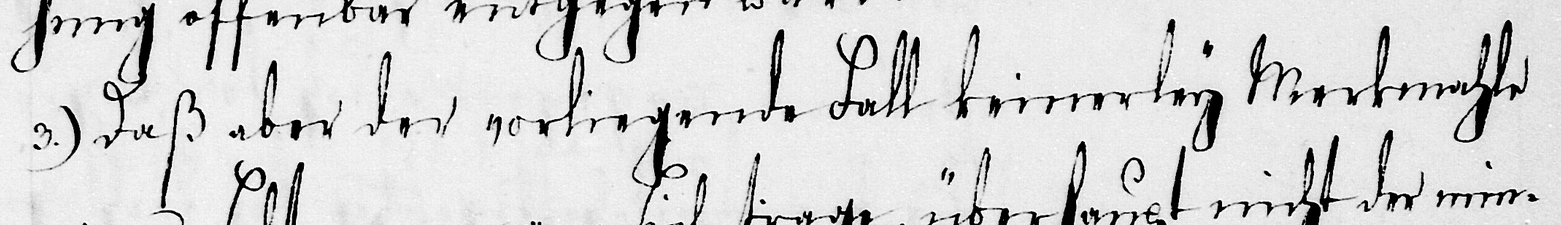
3.) Daß aber der vorliegende Fall keinerley Merkmahle
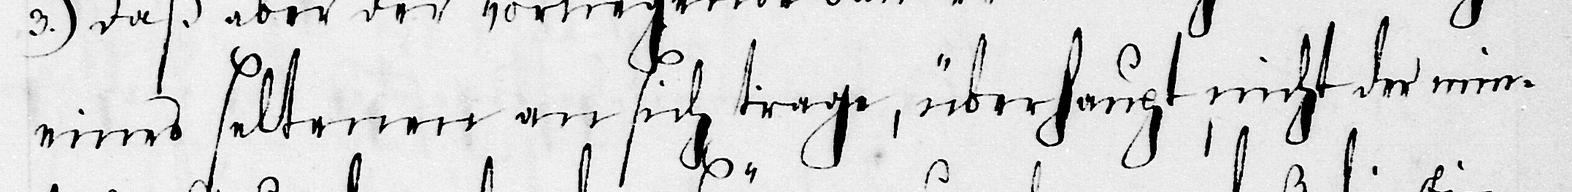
eines seltenen an sich trage, überhaupt nicht der min¬
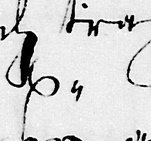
te
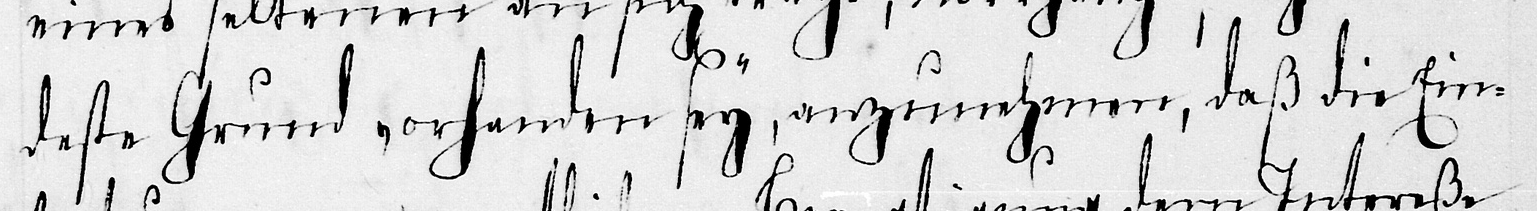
deste Grund vorhanden sey, anzunehmen, daß die Ein¬
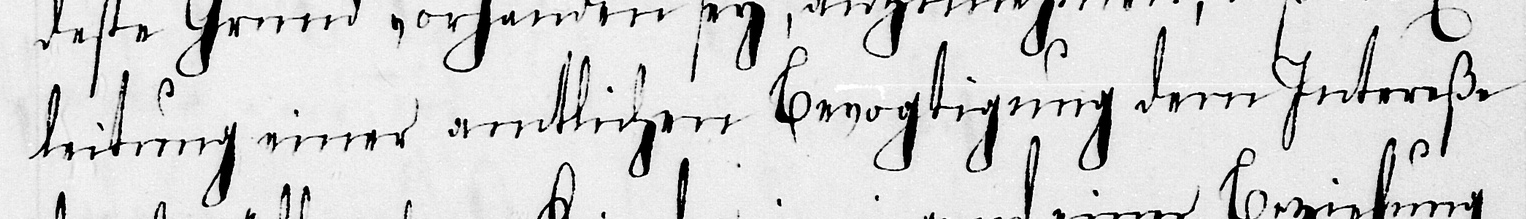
leitung einer amtlichen Bevogtigung dem Intereße
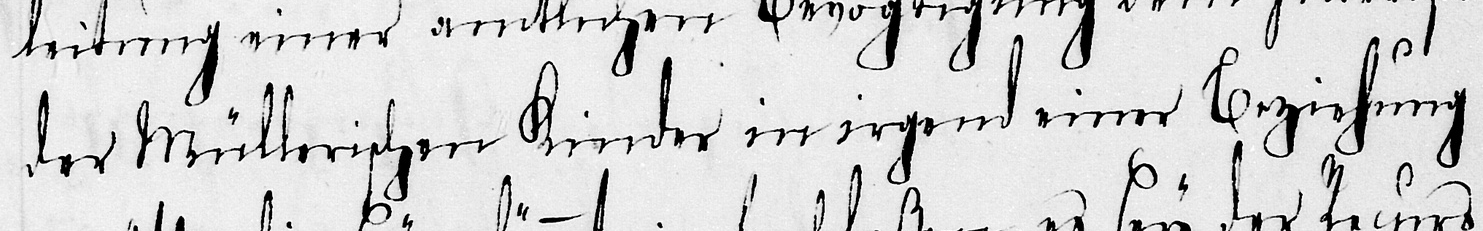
der Müllerischen Kinder in irgend einer Beziehung
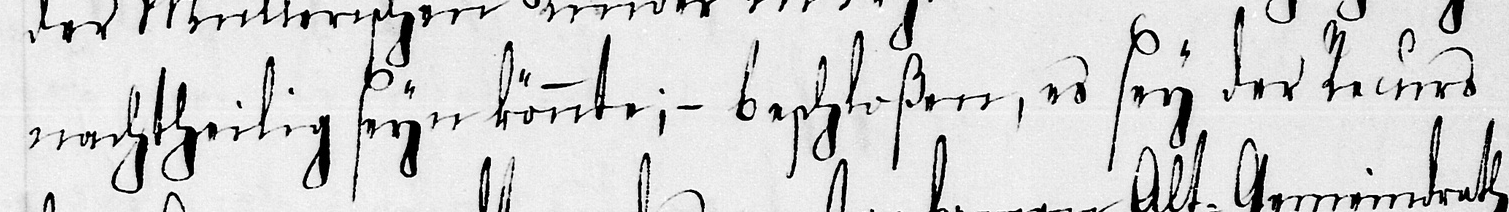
nachtheilig seyn könnte; – beschloßen, es sey der Recurs
